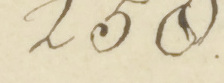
258
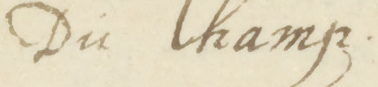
Du Champ.
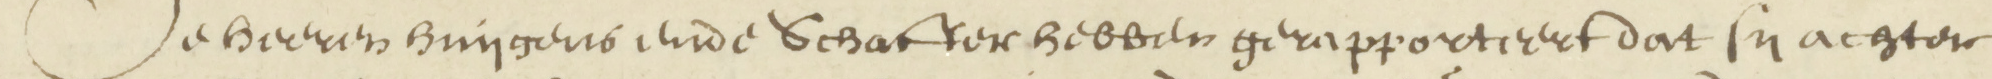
De heeren huygens ende Schaffer hebben gerapporteert dat sy achter
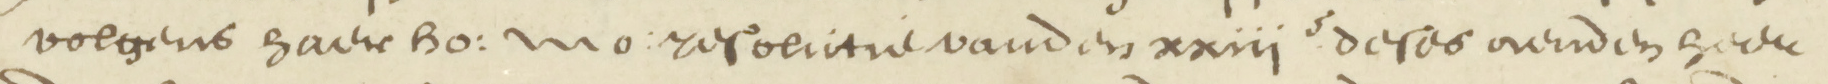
volgens haer ho:Mo: resolutie vanden xxiijen deses aenden heer
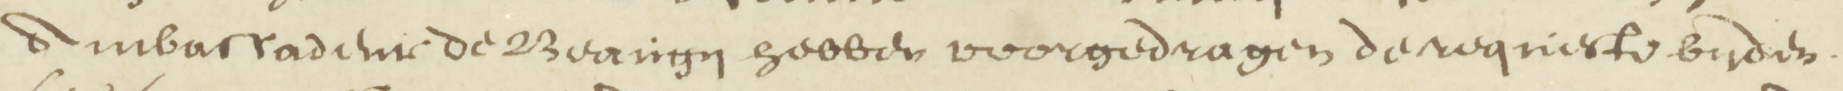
Ambassadeur de Beaugy hebben voorgedragen de requeste byden
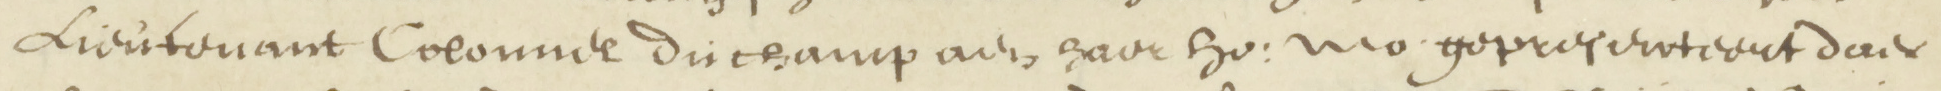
Lieutenant Colonnel Duchamp aen haer ho:Mo: gepresenteert daer
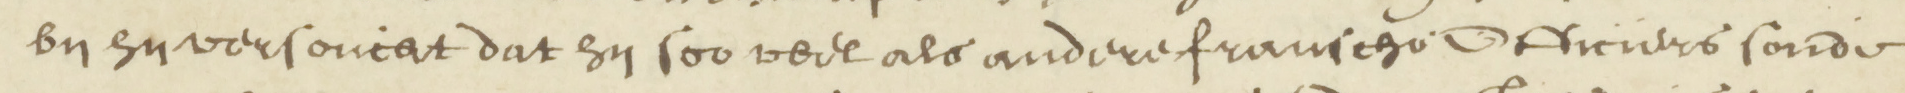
by hy versouckt dat hy soo wel als andere fransche Officiers soude
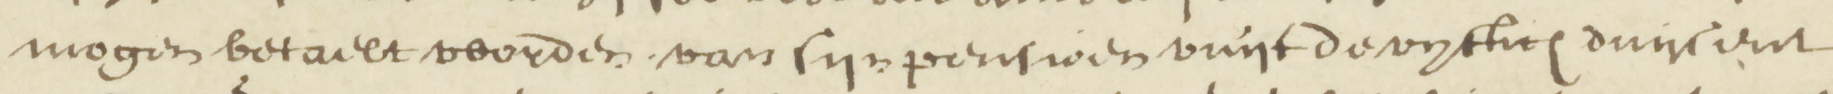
mogen betaelt worden, van syn pensioen vuyt de vyftich duysent
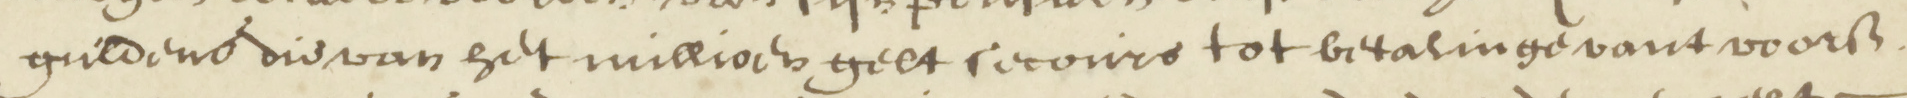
guldens die van het millioen gelt secours tot betalinge vant voors
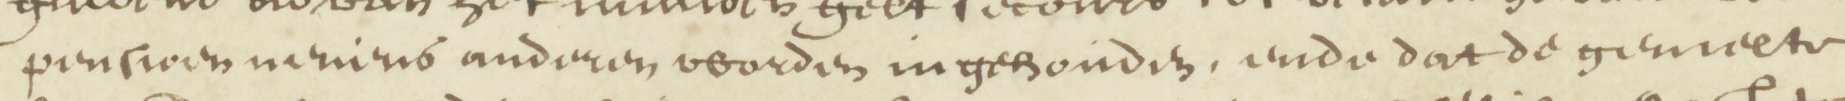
pensioen neuens anderen worden ingehouden, ende dat de gemelte
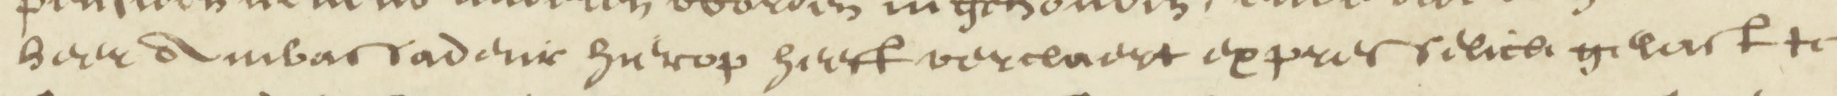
heer Ambassadeur hierop heeft verclaert expresselick gelast te
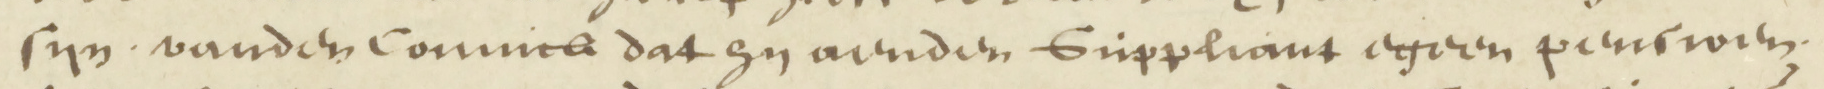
syn vanden Coninck dat hy aenden Suppliant egeen pensioen
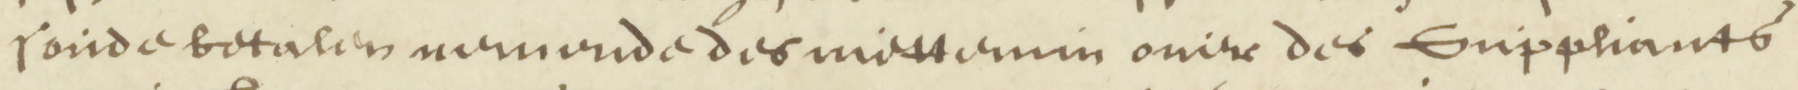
soude betalen nemende des niettemin ouer des Suppliants
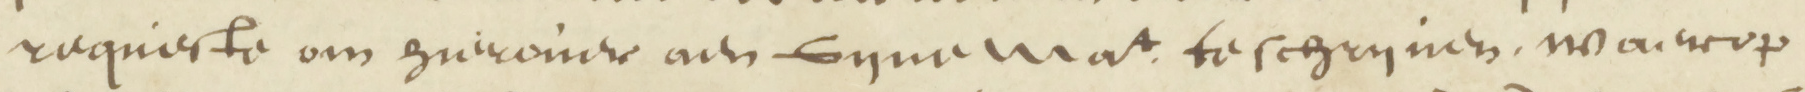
requeste om hierouer aen Syne Mat. te schryven. Waerop
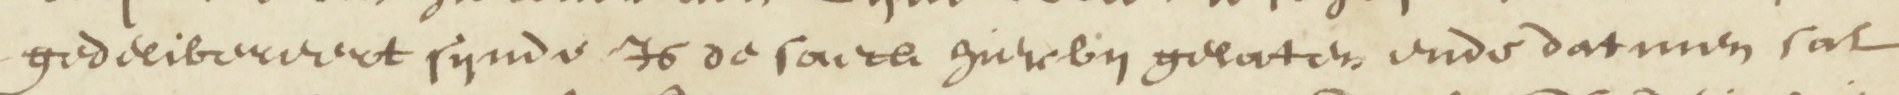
gedelibereert synde Is de saeck hierby gelaten ende datmen sal
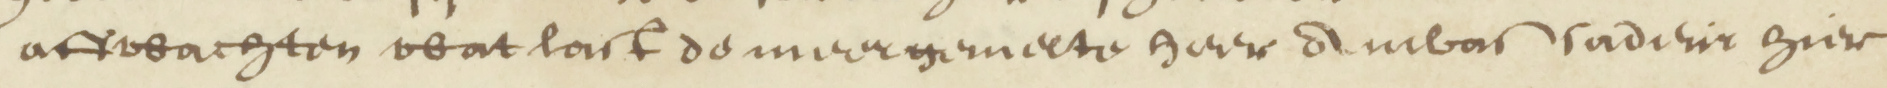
affwachten wat last de meergemelte heer Ambassadeur hier
